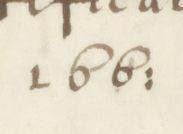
166:
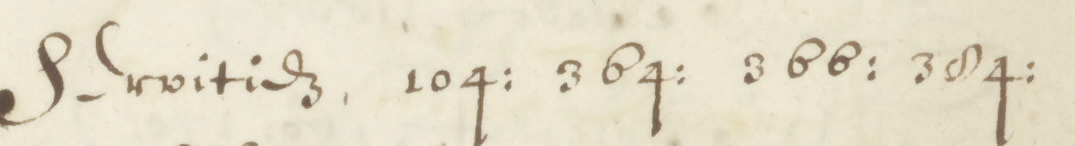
Servitien, 104: 364: 366: 384:
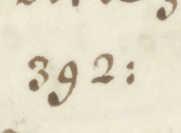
392:
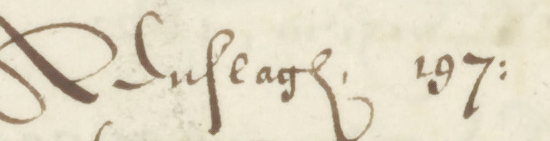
Aenslagh, 197:
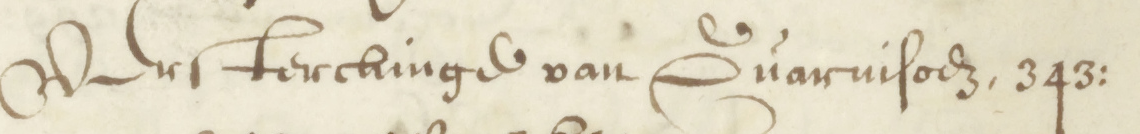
Versterckinge van Guarnisoen, 343:
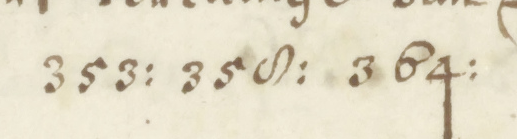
353: 358: 364:
